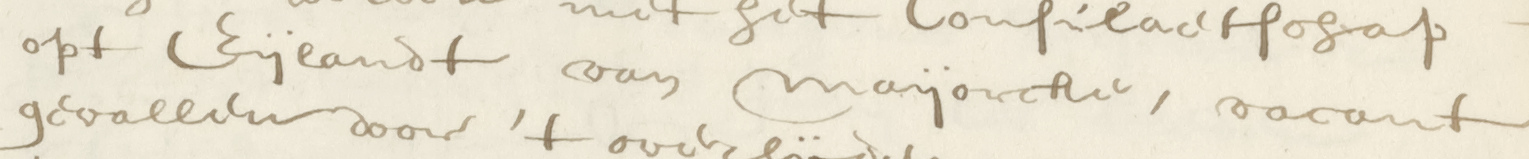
opt Eijlandt van Maijorcke, vacant
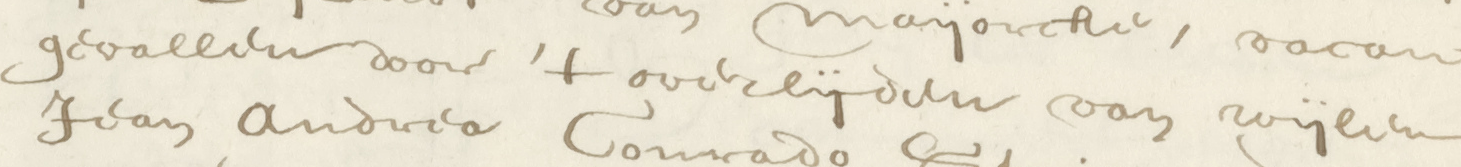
gevallen door 't overlijden van wijlen
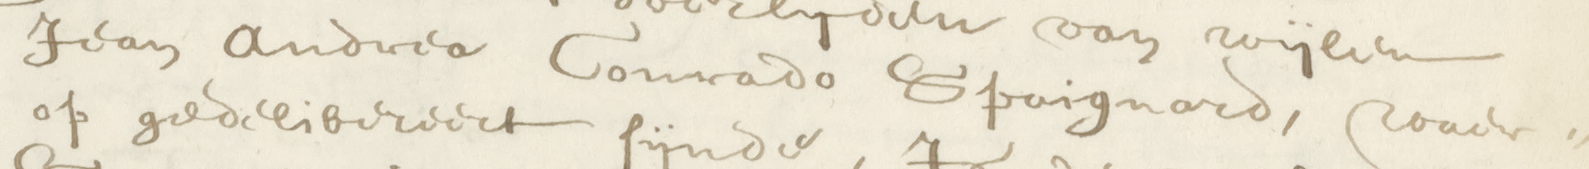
Jean Andrea Conrado Spaignard. waer,,
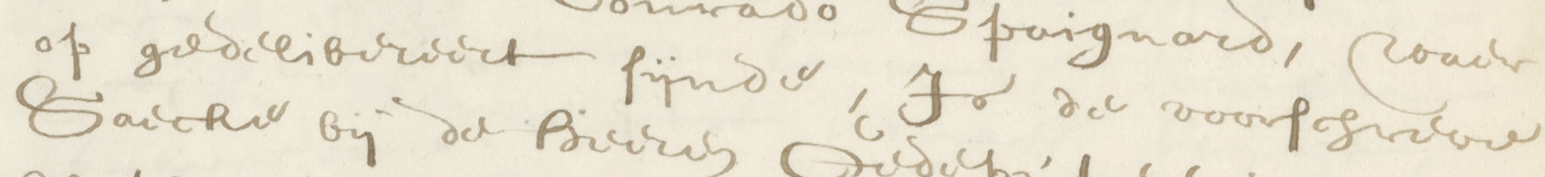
op gedelibereert sijnde, Is de voorschreve
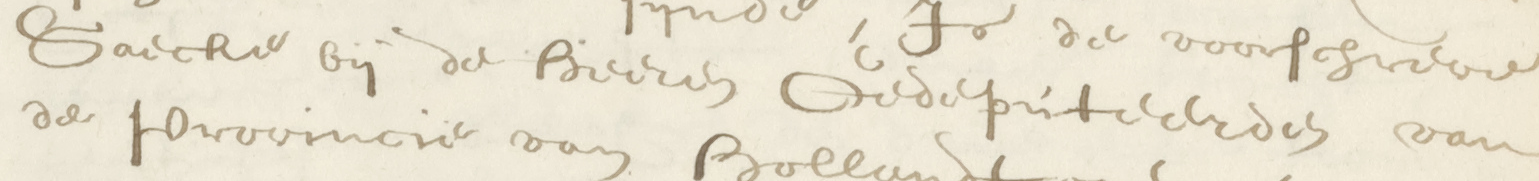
Saecke bij de Heeren Gedeputeerden van
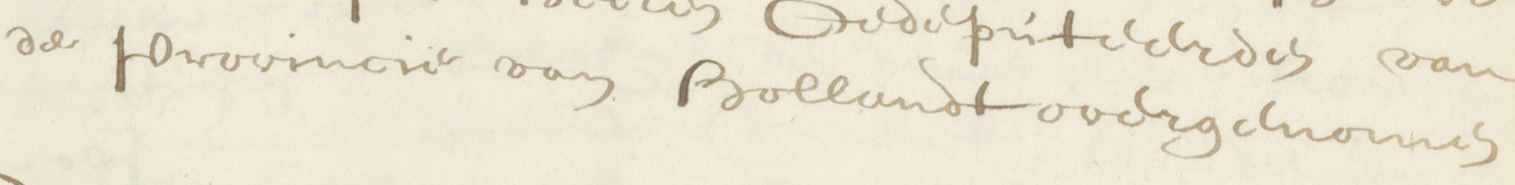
de provincie van Hollandt overgenomen.
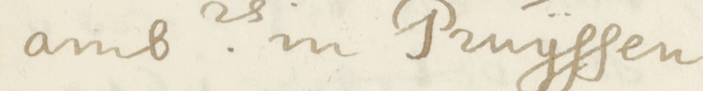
ambrs. in Pruijssen.
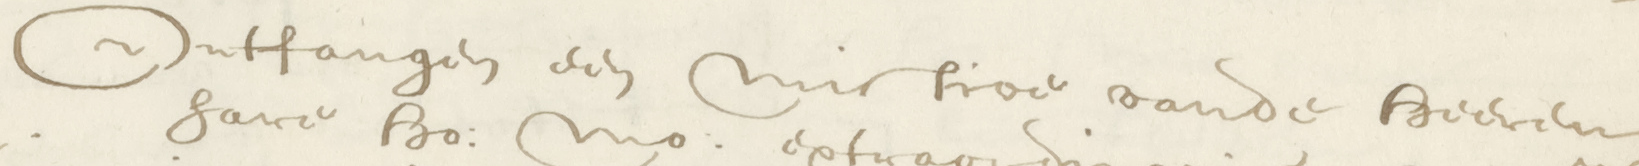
Ontfangen een Missive vande Heeren
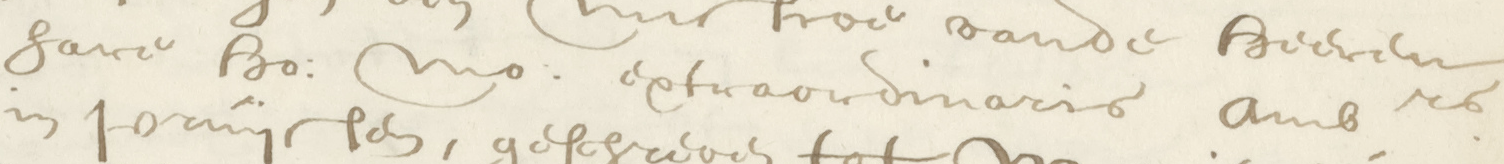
hare Ho:Mo: extraordinaris Ambrs.
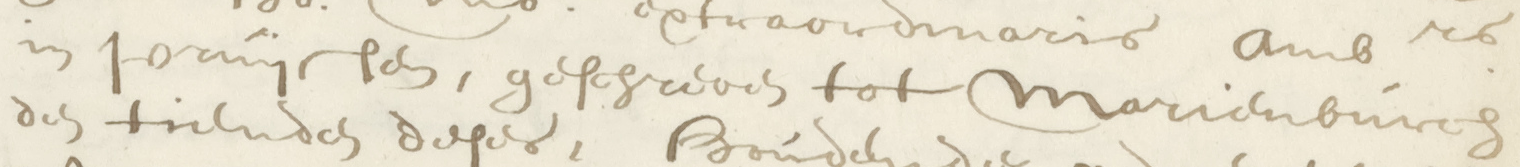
in Pruijssen, geschreven tot Marienburch
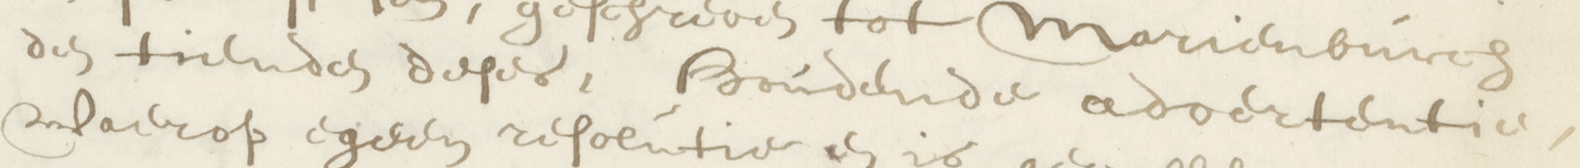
den tienden deses, Houdende advertentie,
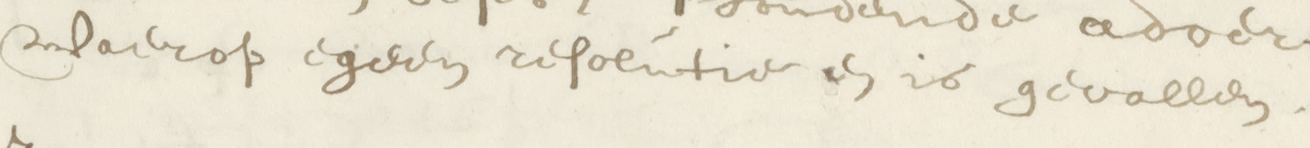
Waerop egeen resolutie en is gevallen.
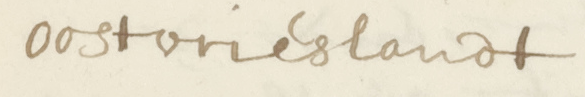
Oostvrieslandt
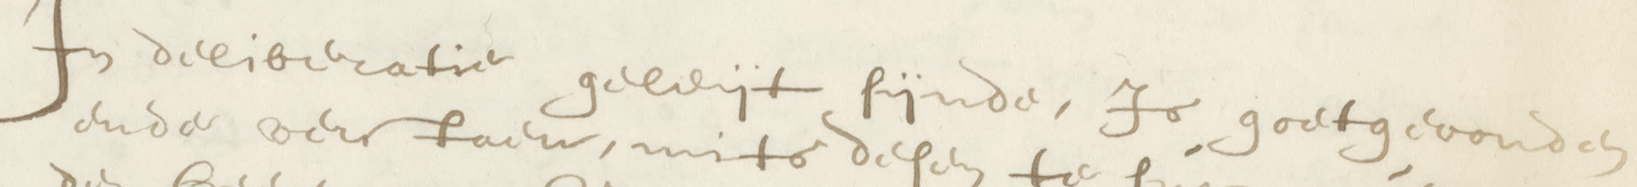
In deliberatie geleijt sijnde, Is goetgevonden
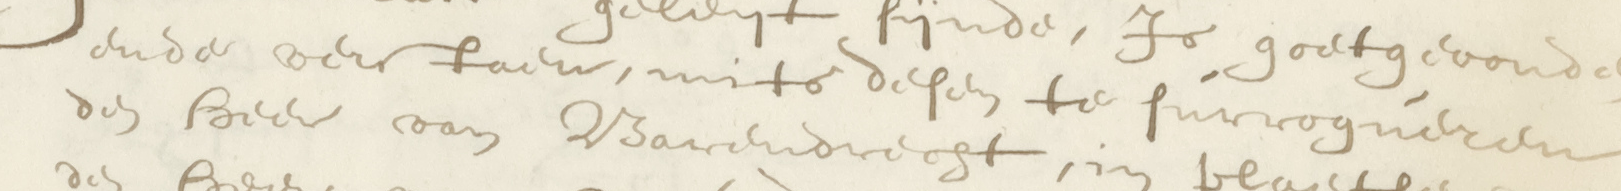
ende verstaen, mits desen te surrogueren
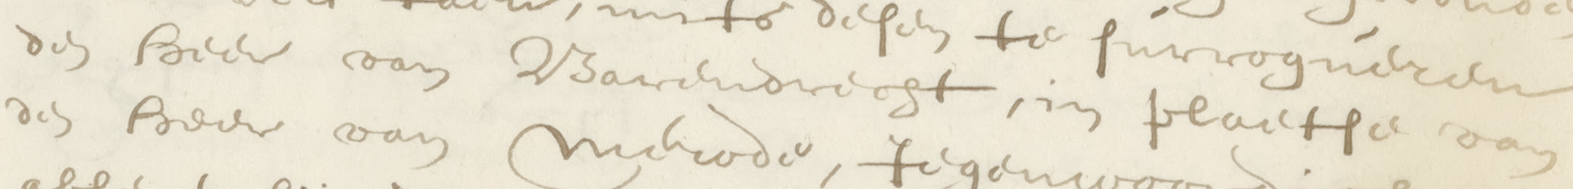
den heer van Barendrecht, in plaetse van
